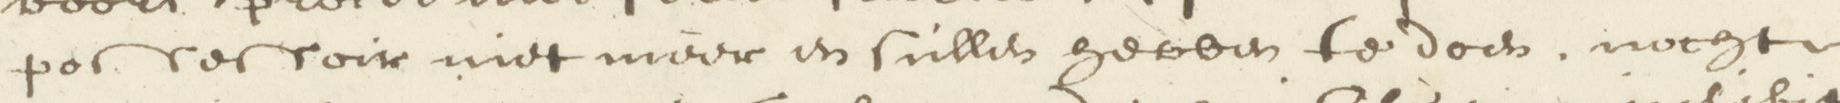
possessoir niet meer en sullen hebben te doen, nochte
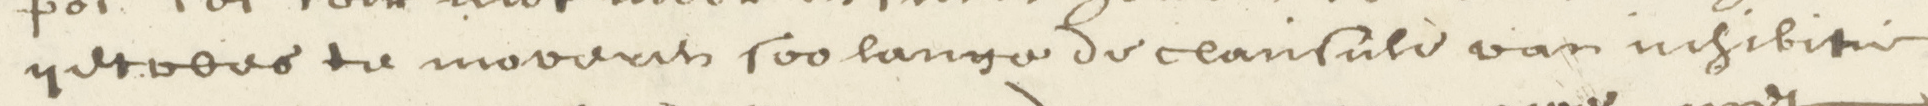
yetwes te moveren soo lange de clausule van inhibitie
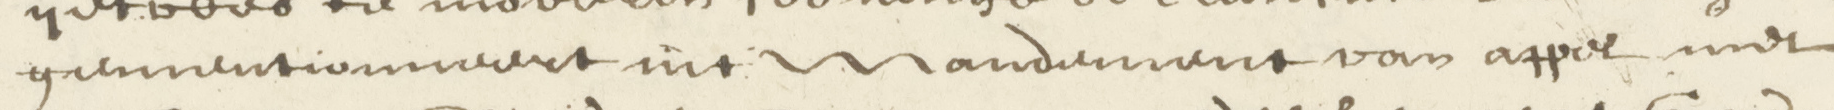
gementionneert int Mandement van appel niet
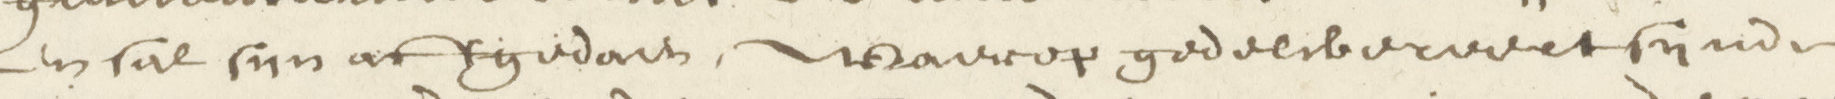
en sal syn affgedaen. Waerop gedelibereert synde
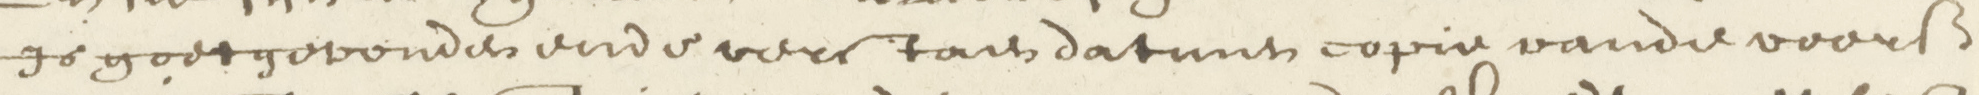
Is goetgevonden ende verstaen datmen copie vande voors
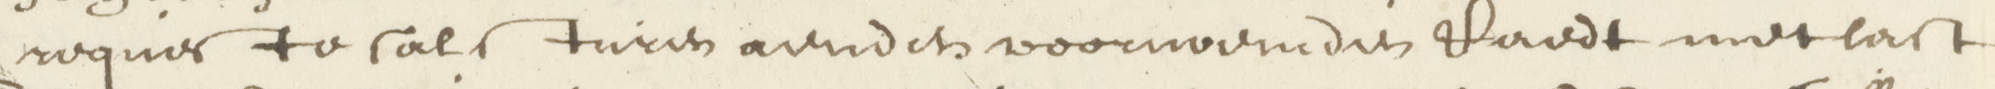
requeste sal sturen aenden voornoemden Raedt met last
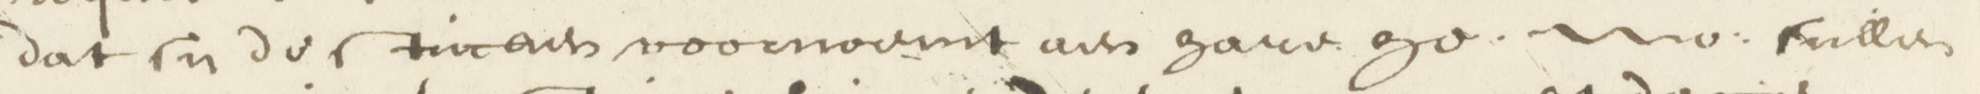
dat sy de stucken voornoemt aen hare Ho:Mo: sullen
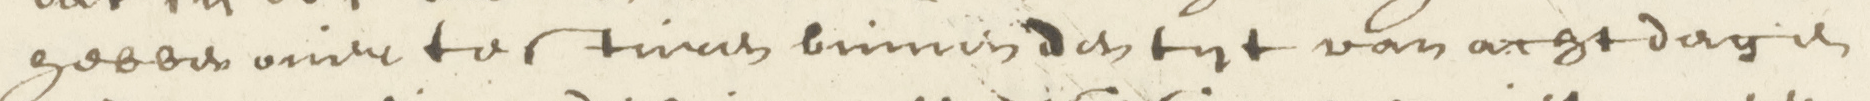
hebben ouer te sturen binnen den tyt van acht dagen
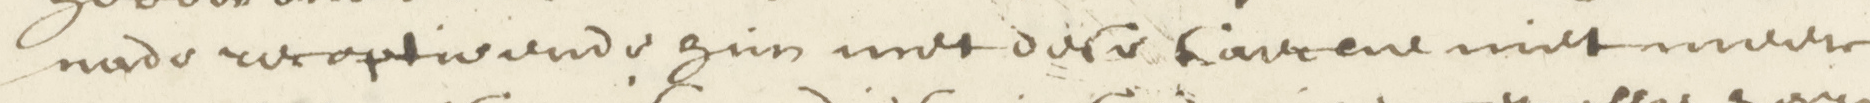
nade receptie ende hun met dese saecke niet meer
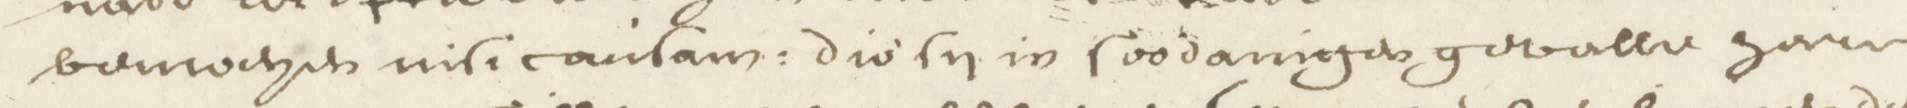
bemoeyen nisi causam: die sy in soodanigen gevalle hare
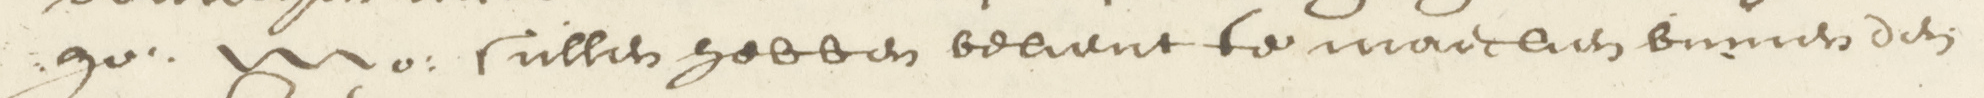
Ho:Mo: sullen hebben bekent te maecken binnen den
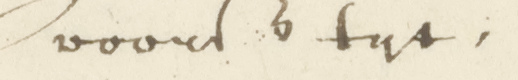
voors tyt.
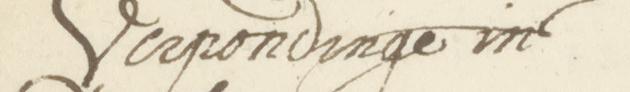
Verpondinge in
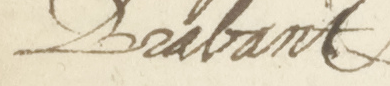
Brabant
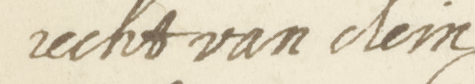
recht van clein
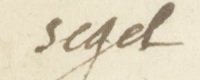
segel
